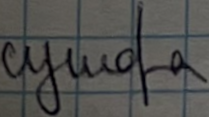сутора
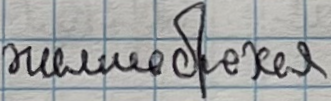желтобрюхая
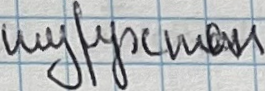турухтан
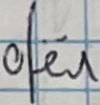орёл
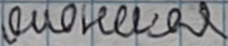японская
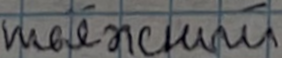таёжный
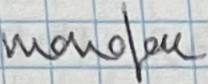топорок
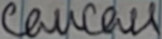сапсан
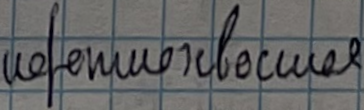короткохвостая
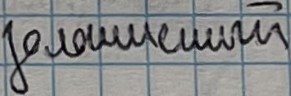золотистый
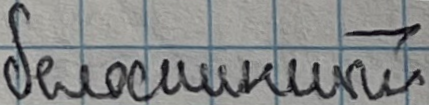белоспинный
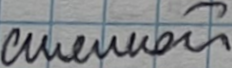степной
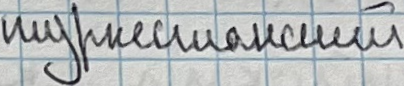туркестанский
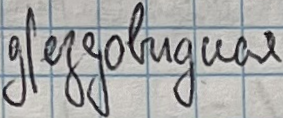дроздовидная
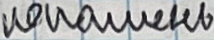лопатень
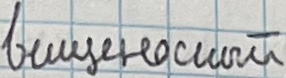венценосный
